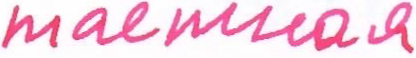таежная
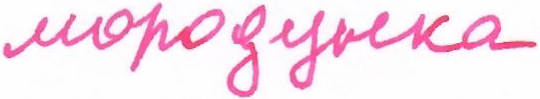мородунка
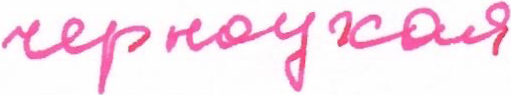черноухая
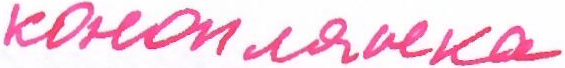коноплянка
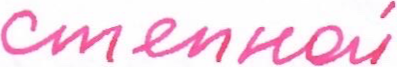степной
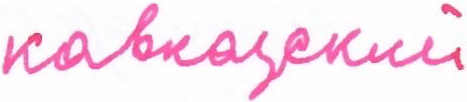кавказский
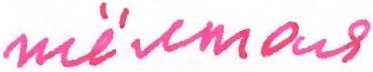жёлтая
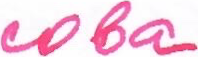сова
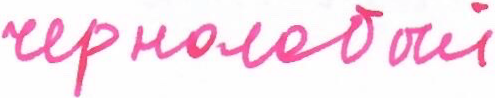чернолобый
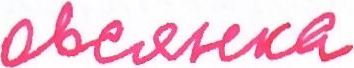овсянка
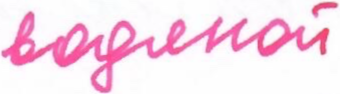водяной
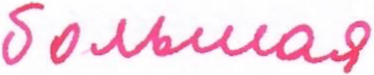большая
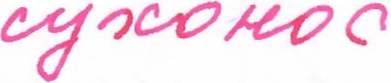сухонос
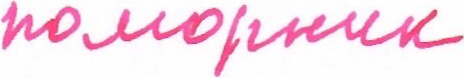поморник
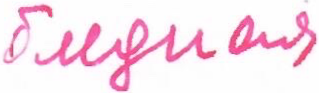бледная
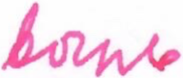выпь
